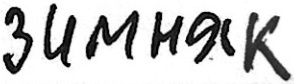зимняк
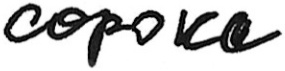сорока
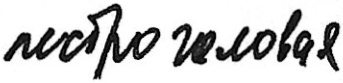пестроголовая
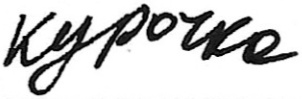курочка
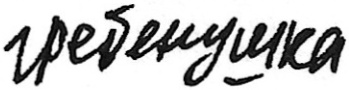гребенушка
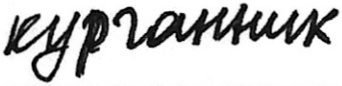курганник
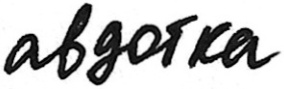авдотка
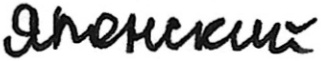японский
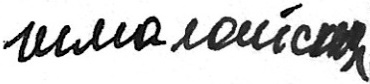гималайская
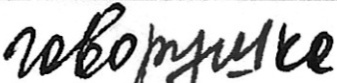говорушка
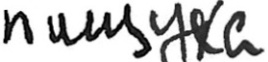пищуха
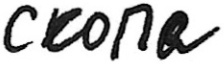скопа
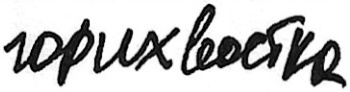горихвостка
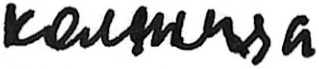колпица
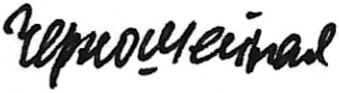черношейная
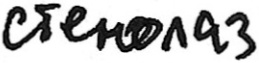стенолаз
